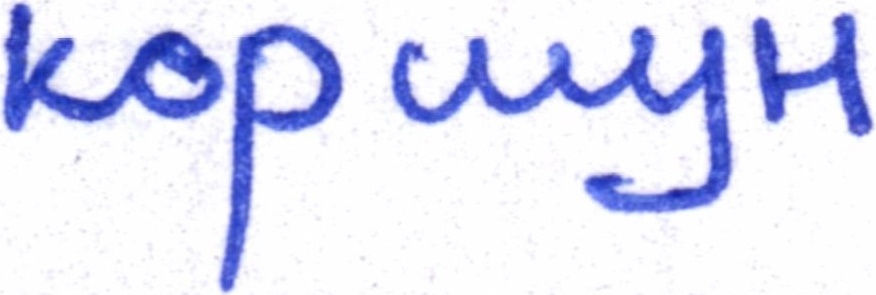коршун
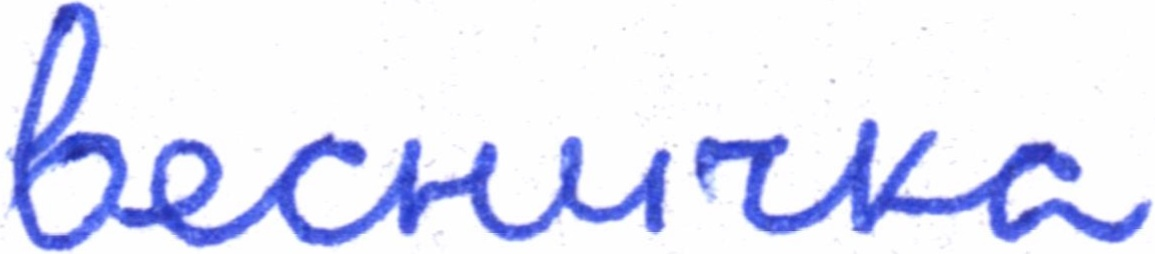весничка
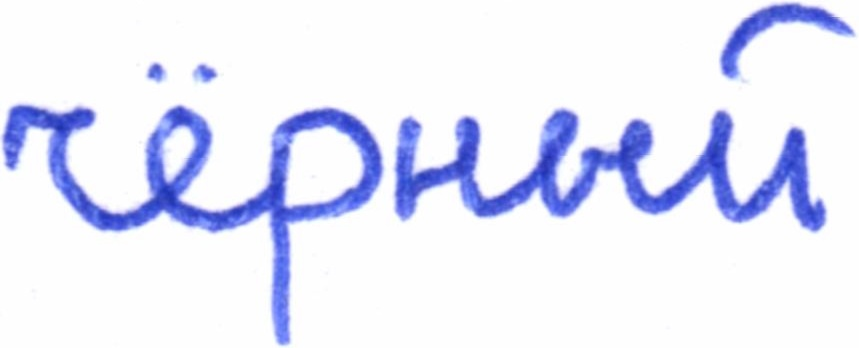чёрный
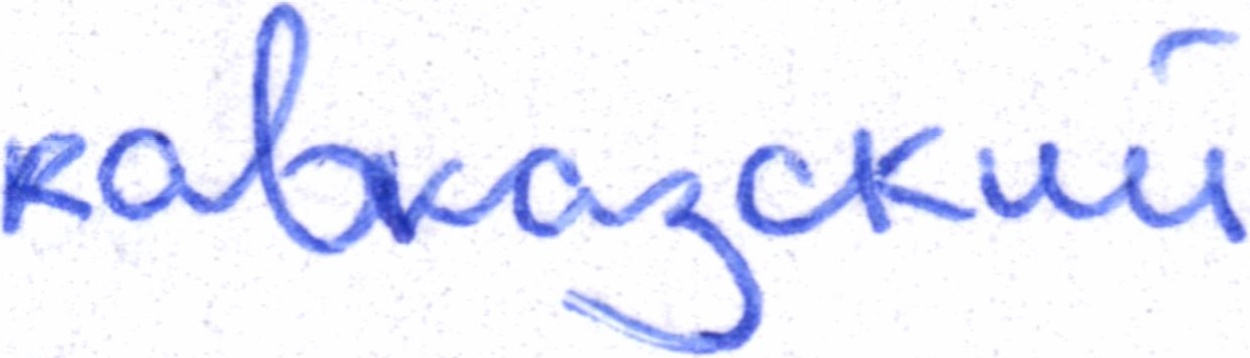кавказский
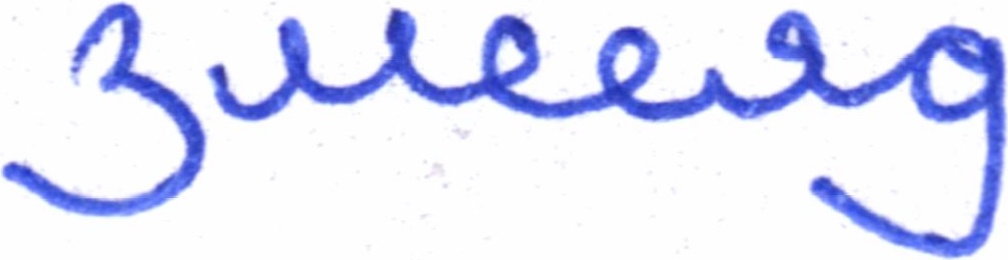змееяд
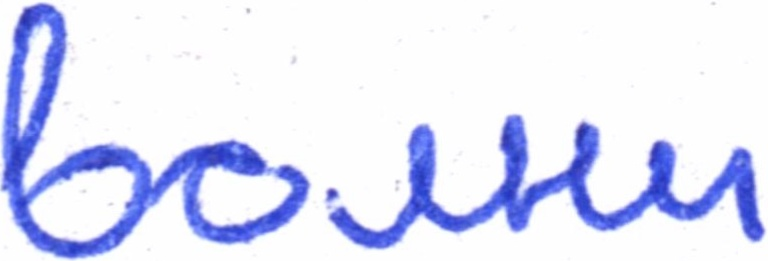волни
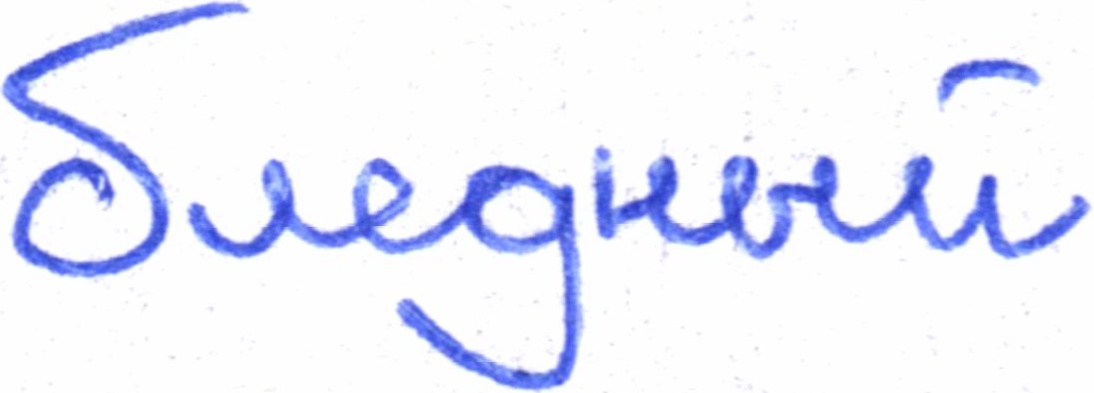бледный
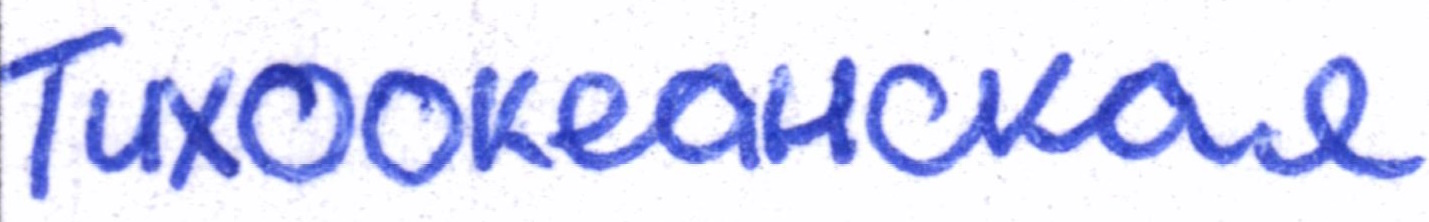тихоокеанская
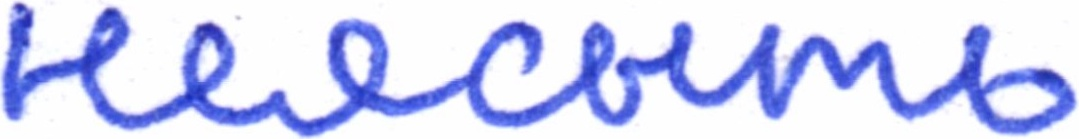неясыть
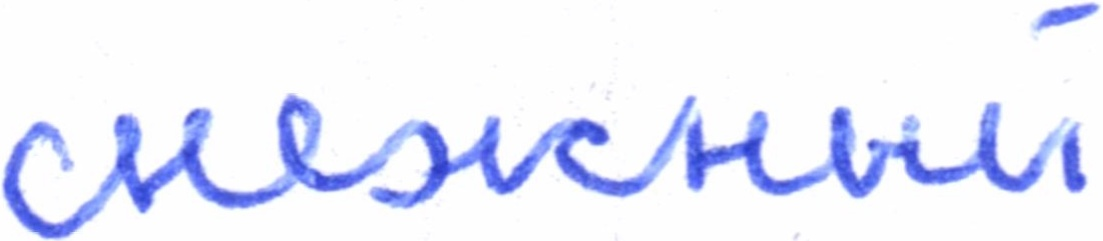снежный
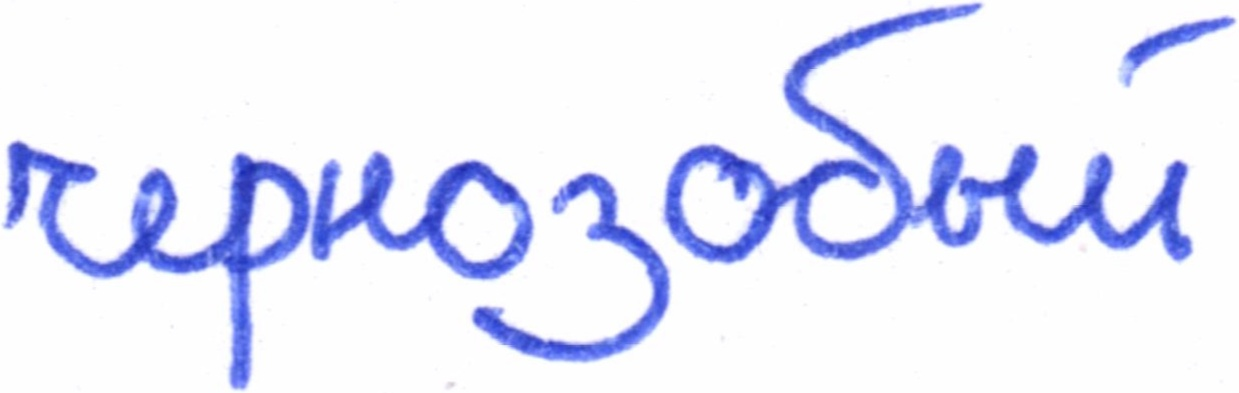чернозобый
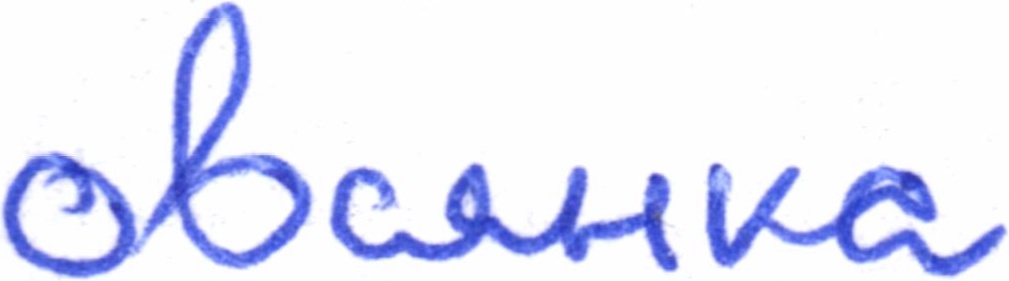овсянка
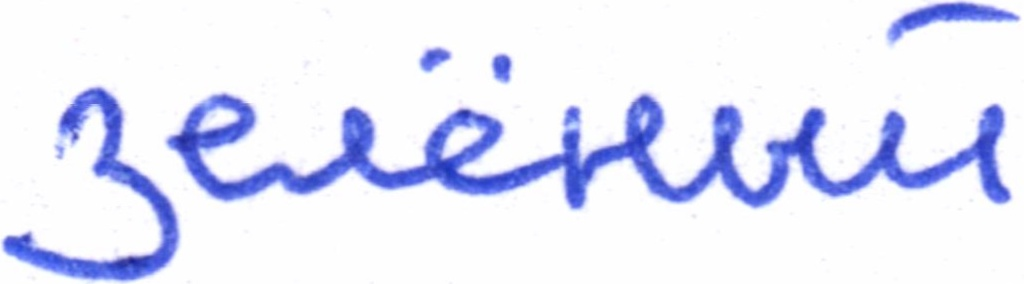зелёный
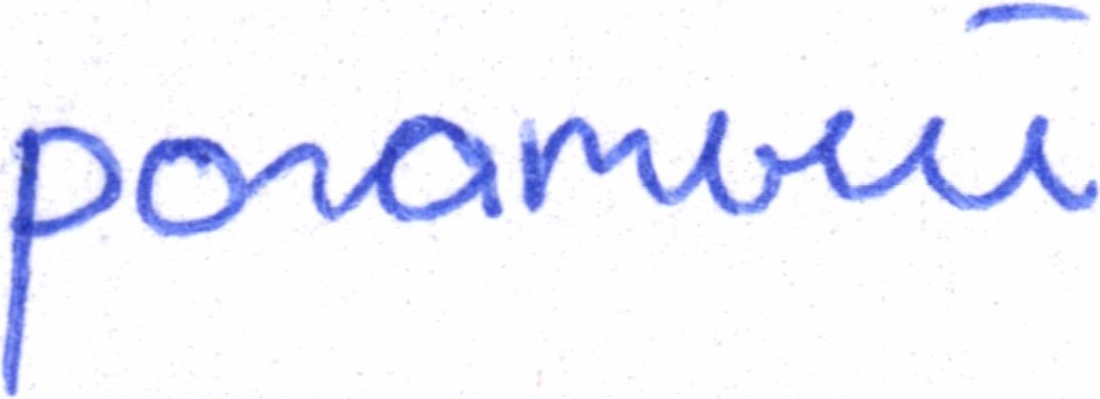рогатый
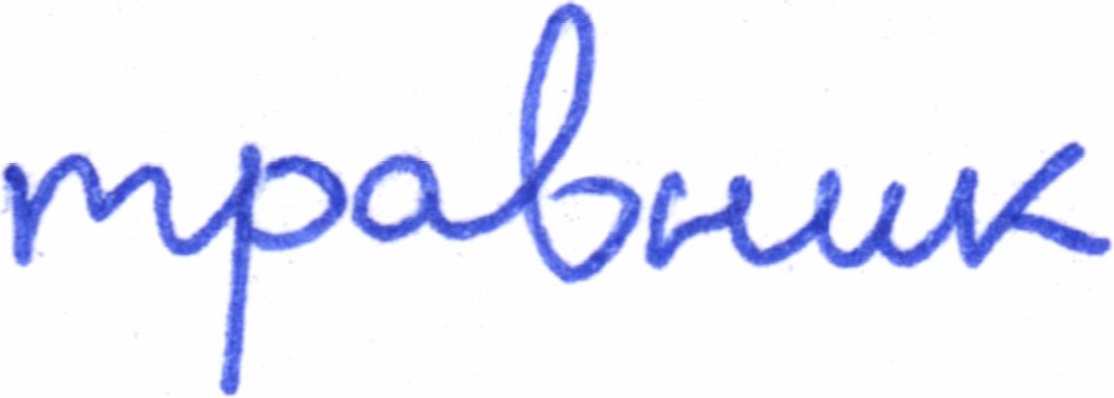травник
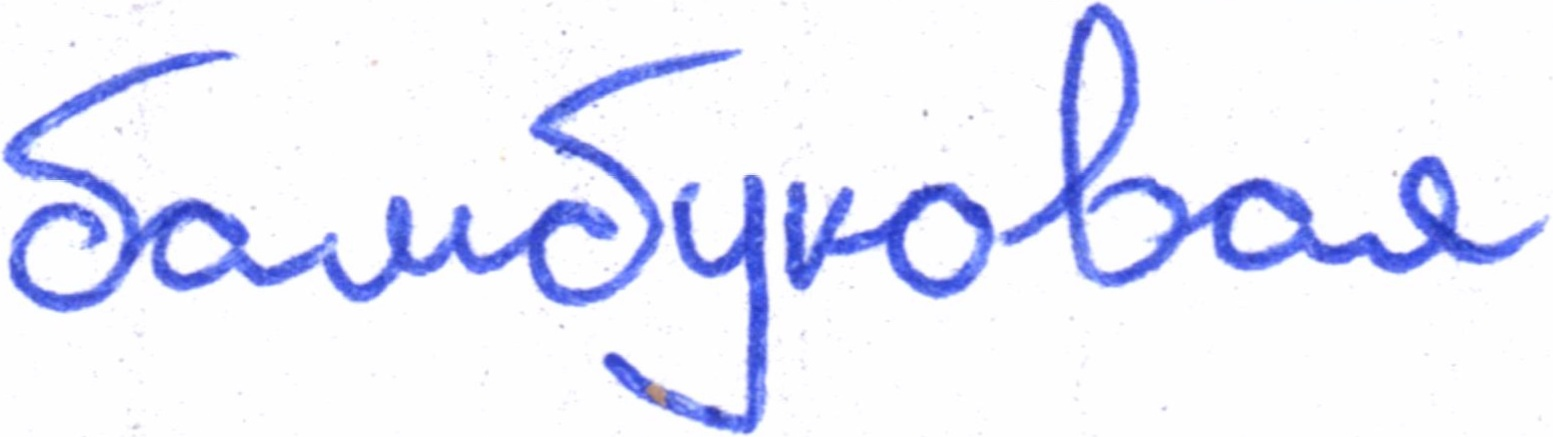бамбуковая
